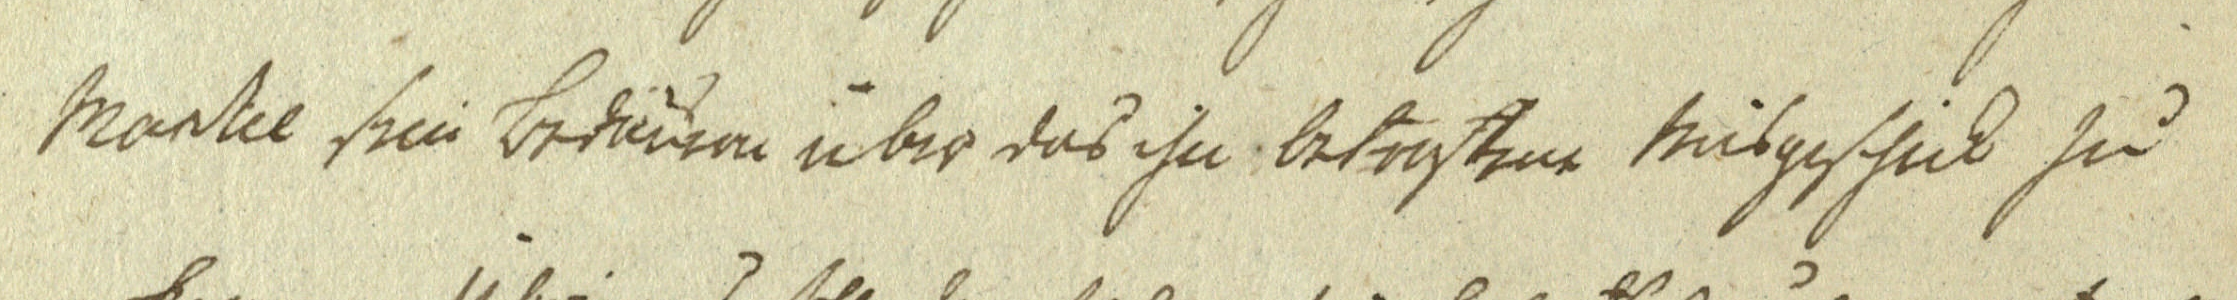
Manzel sein Bedauern über das ihn betroffene Misgeschick zu
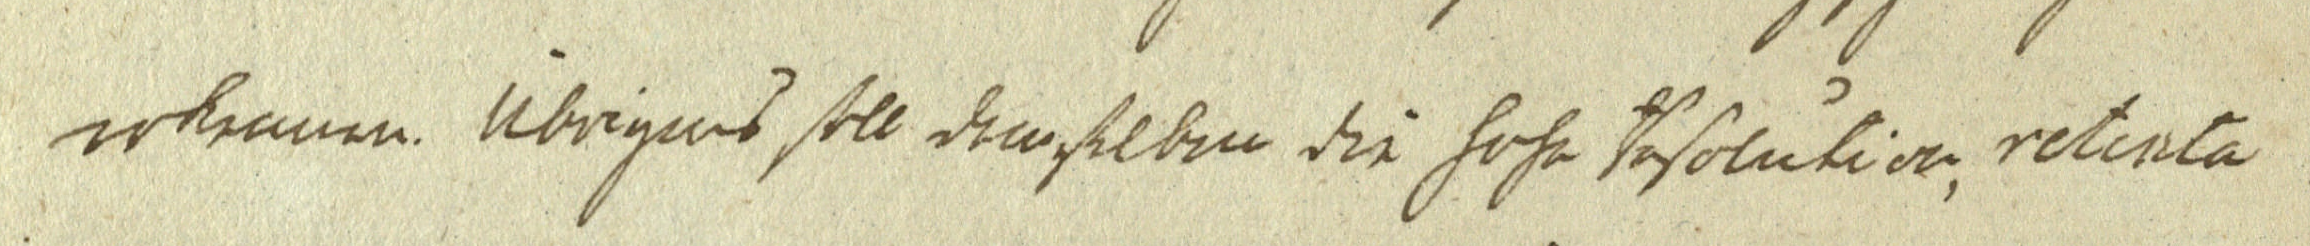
erkennen. Übrigens soll demselben die hohe Resolution, retenta
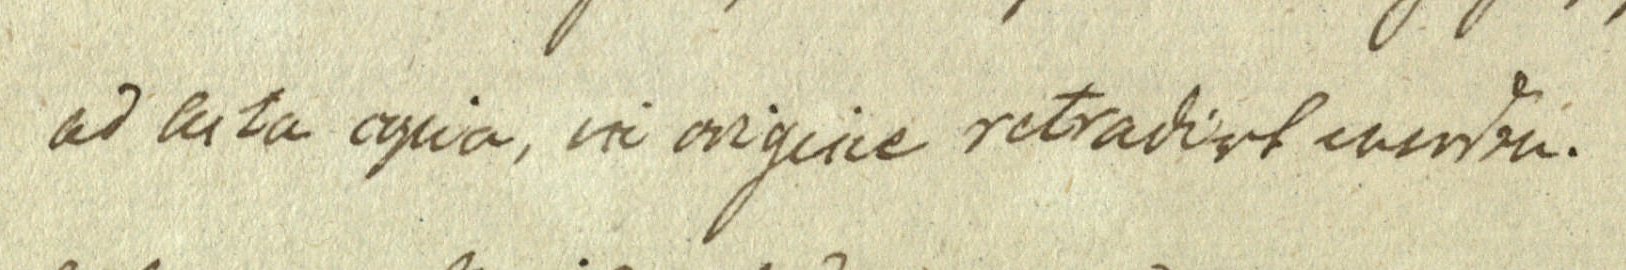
ad Acta copia, in origine retradirt werden.
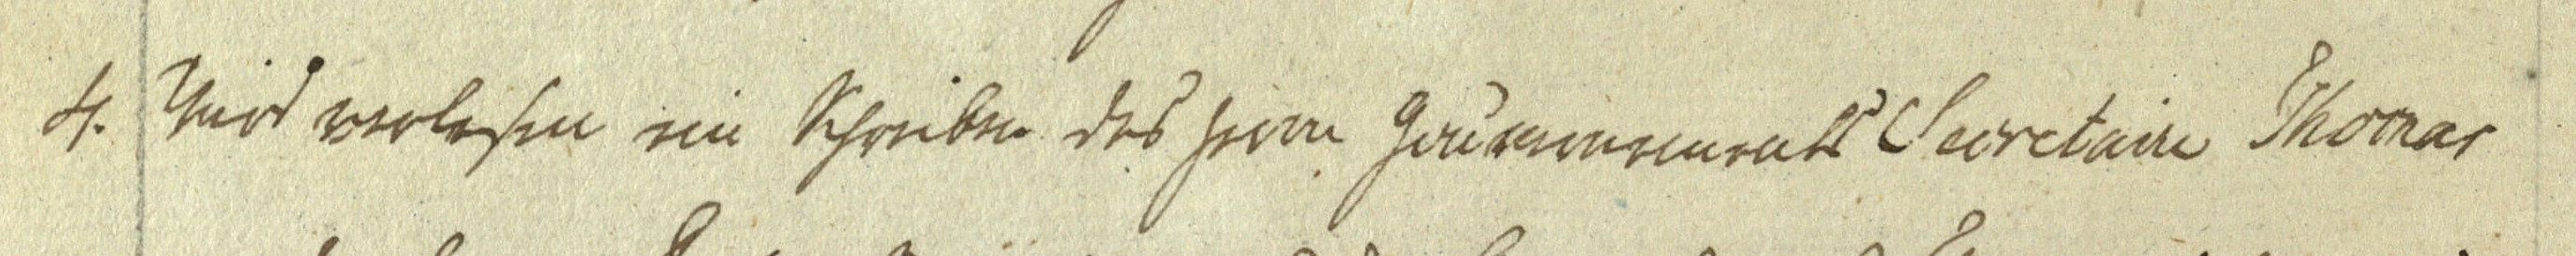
4. Wird verlesen ein Schreiben des Herrn Gouvernements Secretaire Thomas
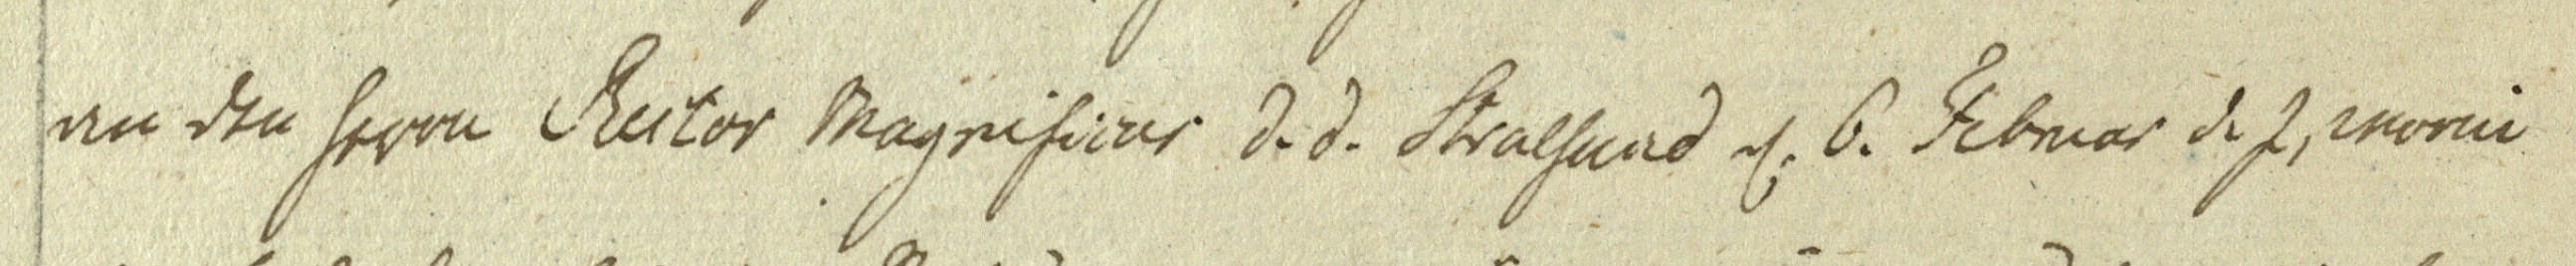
an den Herrn Rector Magnificus d. d. Stralsund d. 6. Februar d. J, worin
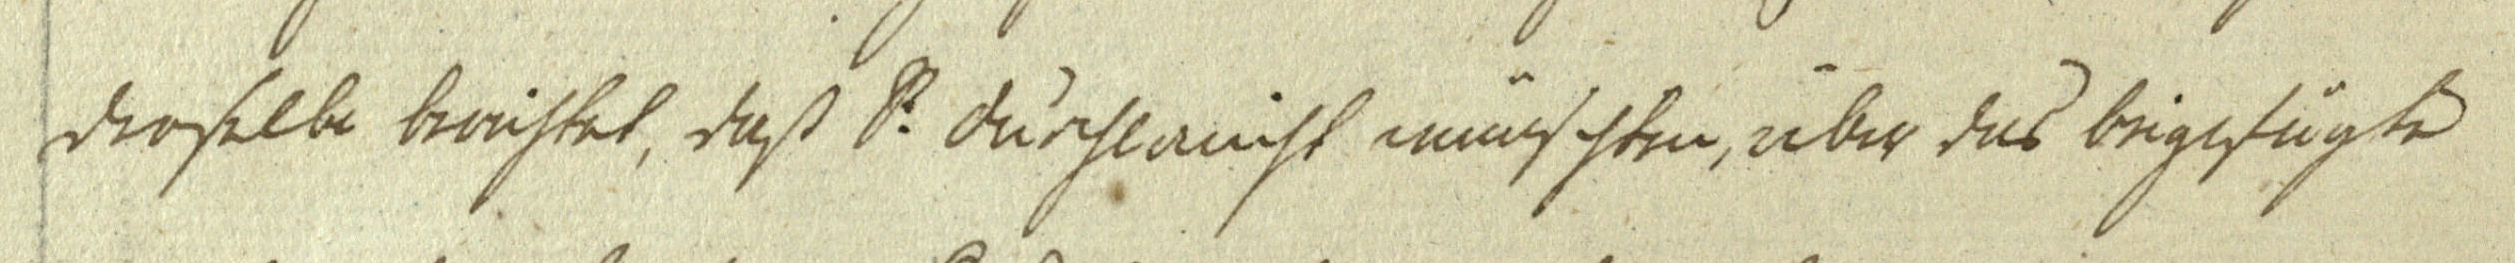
derselbe berichtet, daß Sr Durchlaucht wünschten, über das beigefügte
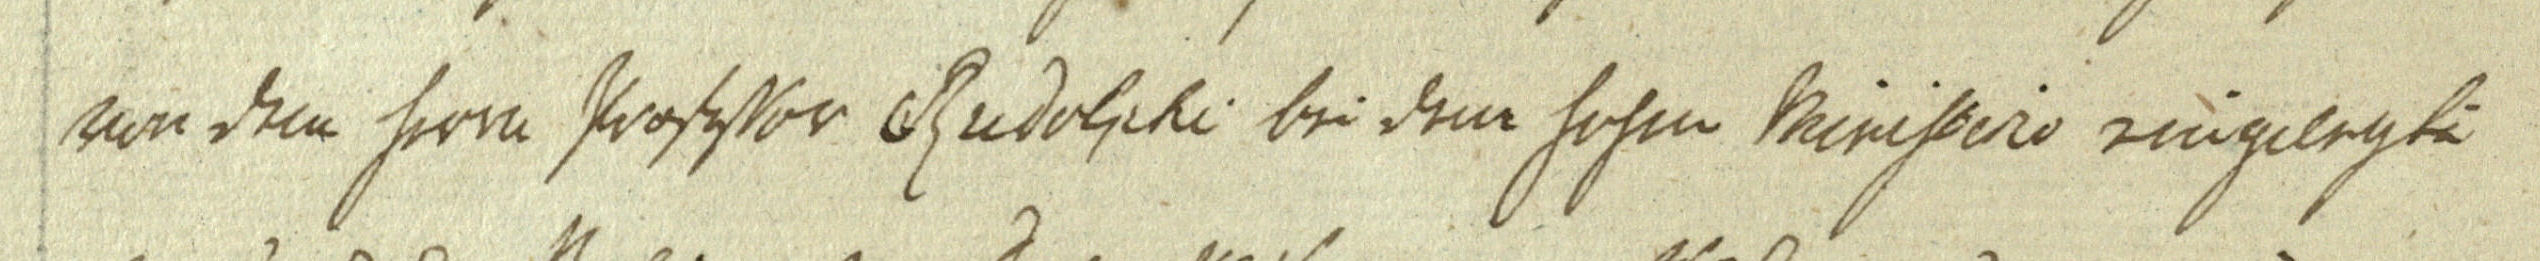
von dem Herrn Professor Rudolphi bei dem hohen Ministerio eingelegte
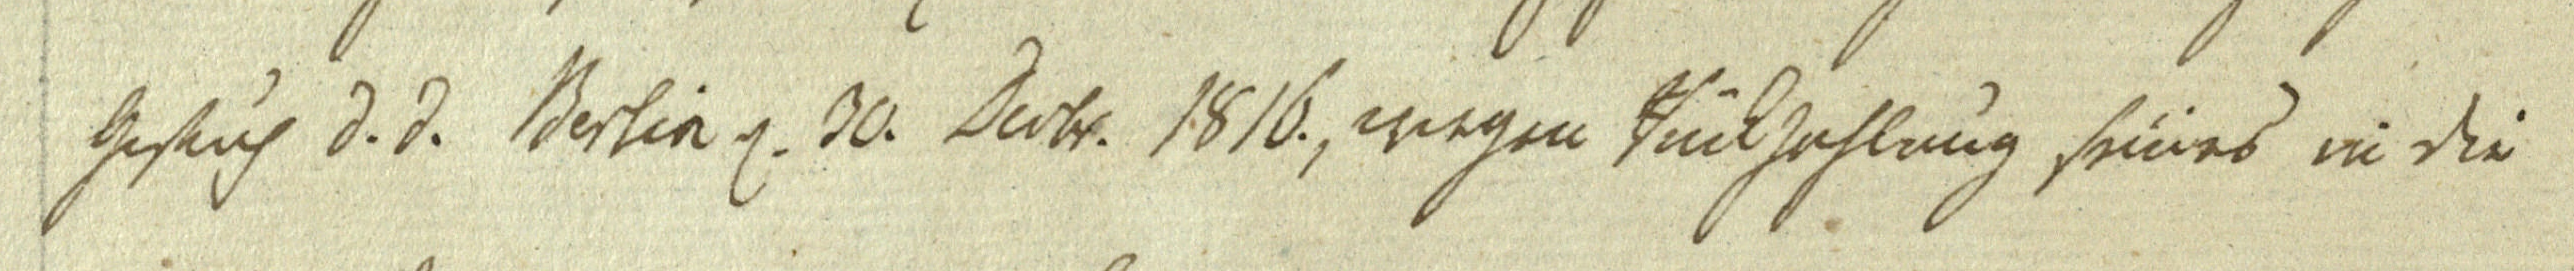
Gesuch d. d. Berlin d. 30. Decbr. 1816., wegen Rückzahlung seines in die
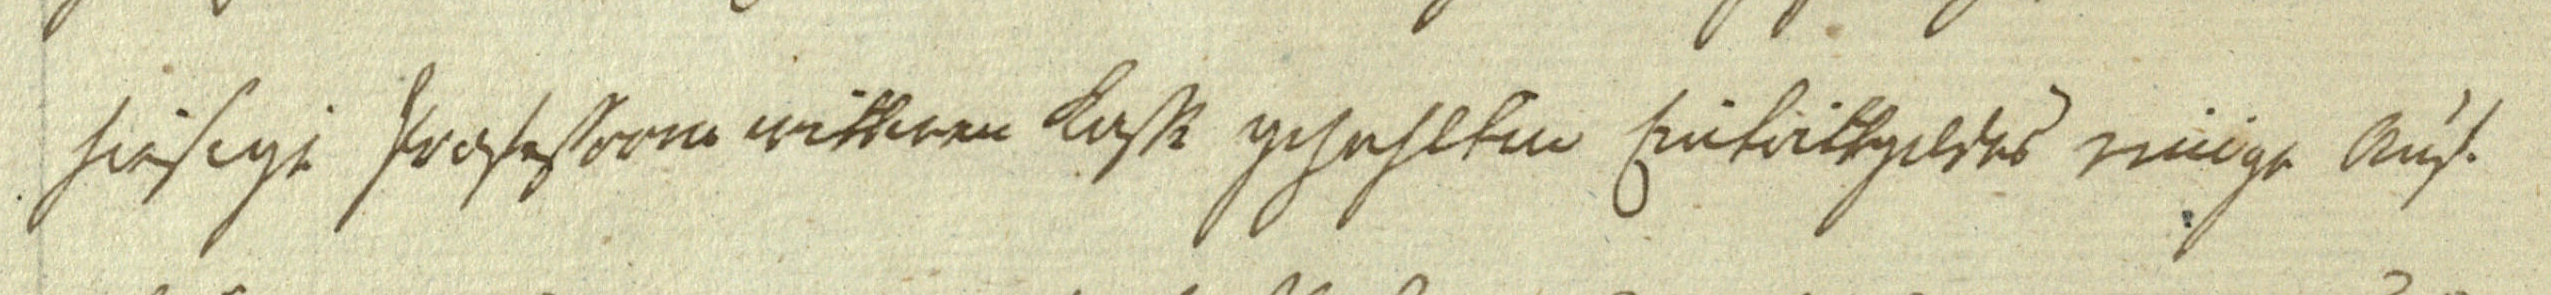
hiesige Professoren wittwen Kasse gezahlten Eintrittgeldes einige Auf¬
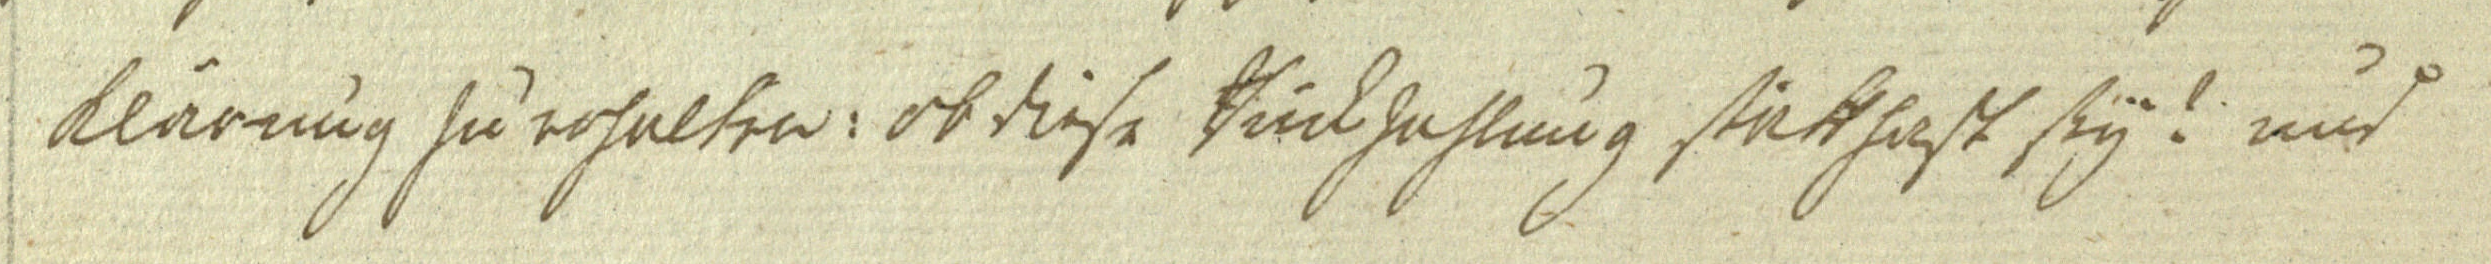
klärung zu erhalten: ob diese Rückzahlung statthaft seÿ ? und
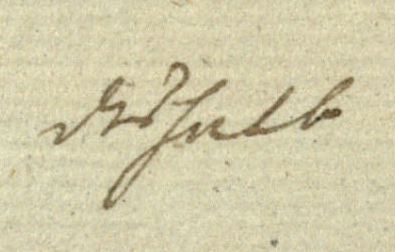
deshalb
